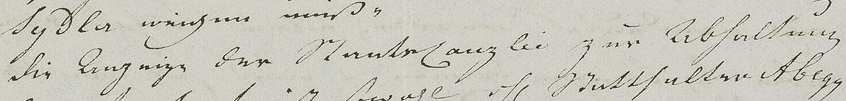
Die Anzeige der StaatsCanzlei zur Abhaltung
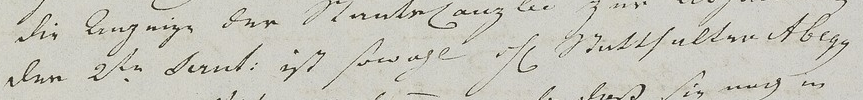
des 2ten Scrut: ist sowohl H Statthalter Abegg
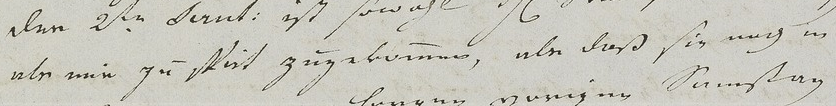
als mir zu spät zugekommen, als daß sie noch in
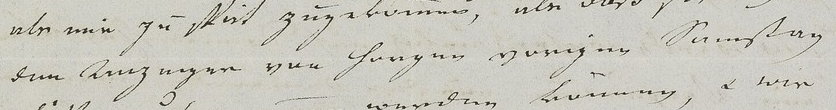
den Anzeiger von Horgen vorigen Samstag
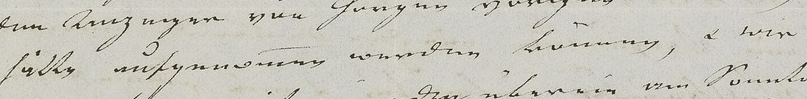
hätte aufgenommen werden können, & wir
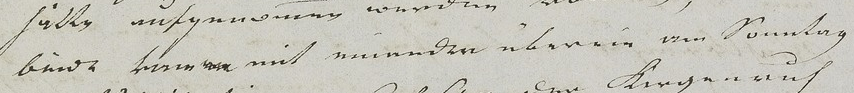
beide kamen mit einander überein am Sonntag
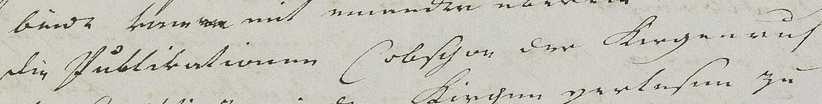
die Publikationen (obschon der Kirchenruf
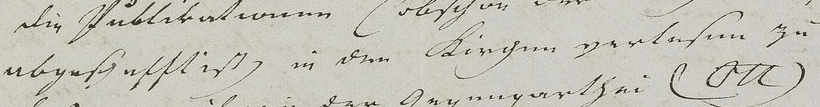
abgeschafft ist), in den Kirchen verlesen zu
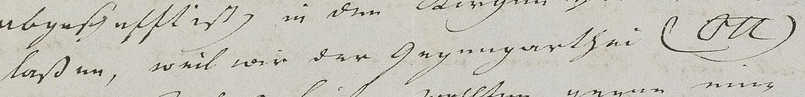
laßen, weil wir der Gegenparthei (Ott)
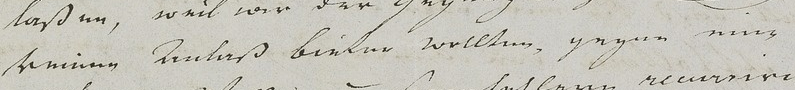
keinen Anlaß bieten wollten, gegen eine
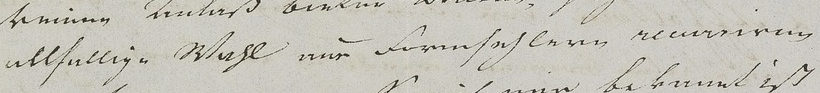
allfällige Wahl aus Formfehlern recurriren
